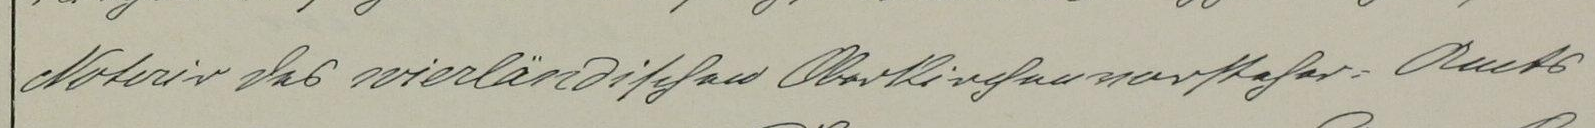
Notair des wierländischen Oberkirchenvorsteher-Amts
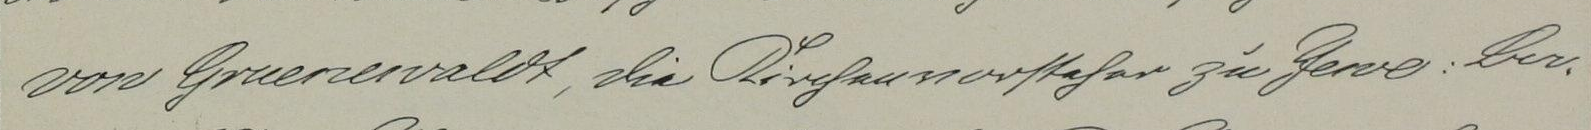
von Gruenewaldt, die Kirchenvorsteher zu Jewe: Ba-
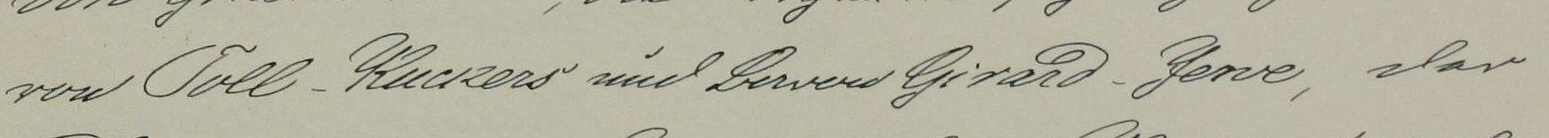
ron von Toll-Kuckers und Baron Girard-Jewe, der
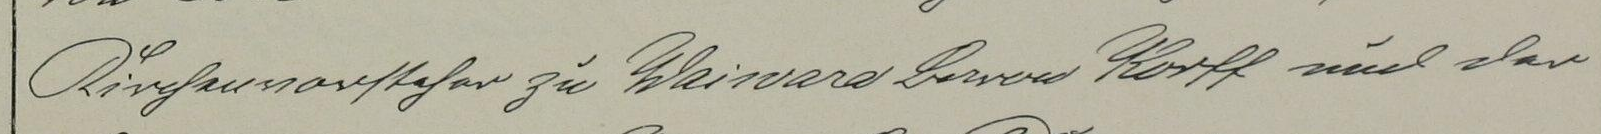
Kirchenvorsteher zu Waiwara Baron Korff und der
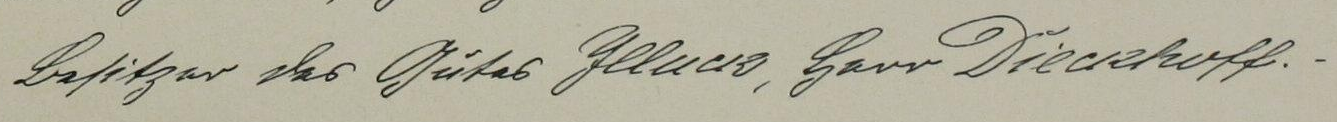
Besitzer des Gutes Illuck, Herr Dieckhoff.
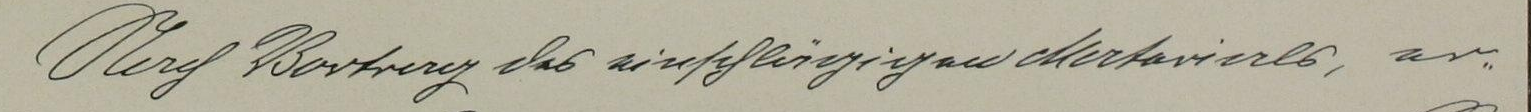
Nach Vortrag des einschlägigen Materials, er-
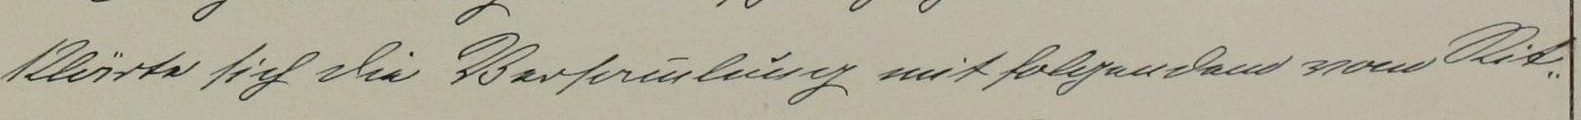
klärte sich die Versammlung mit folgendem vom Rit-
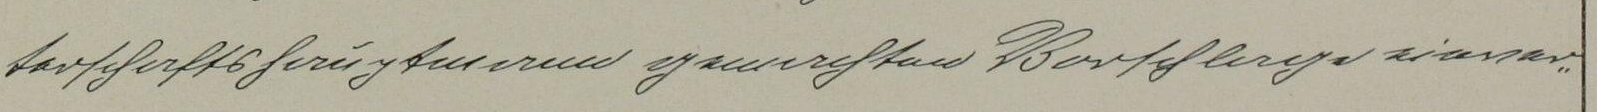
terschaftshauptmann gemachten Vorschlage einver-
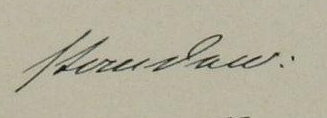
standen:
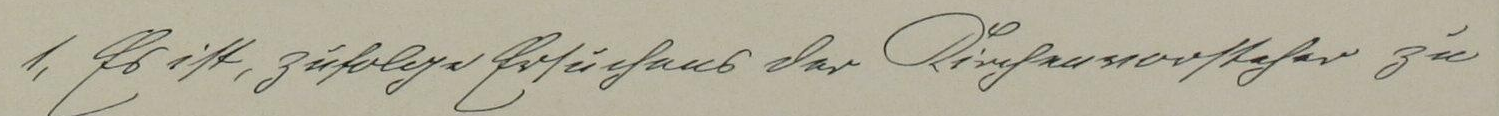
1. Es ist, zufolge Ersuchens der Kirchenvorsteher zu
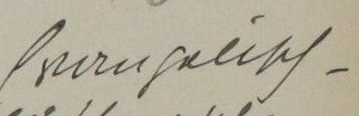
Evangelisch-
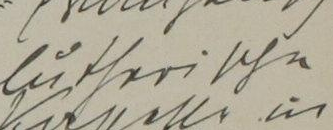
lutherische
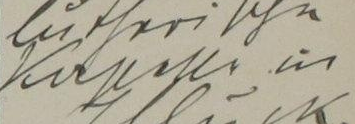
kapelle in
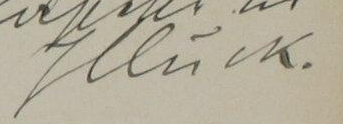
Illuck.
